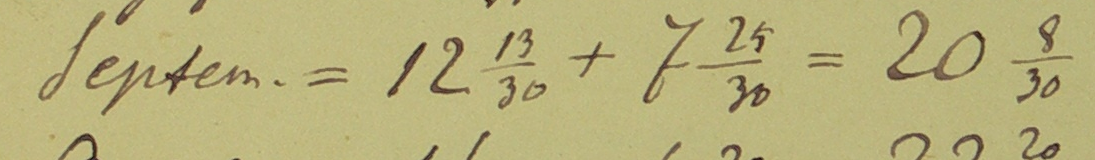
Septem. = 12 13/30 + 7 25/30 = 20 20/31
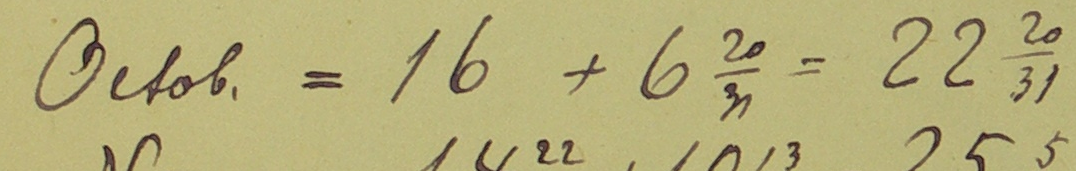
Oktob. = 16 + 6 20/31 = 22 20/31
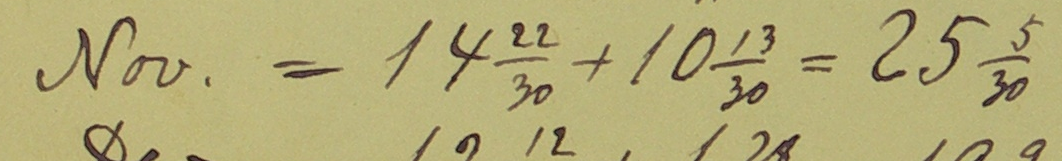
Nov. = 14 22/30 + 10 13/30 = 25 5/30
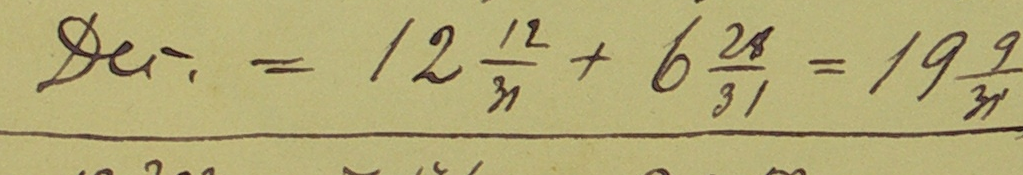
Dez. = 12 12/31 + 6 21/31 = 19 9/31
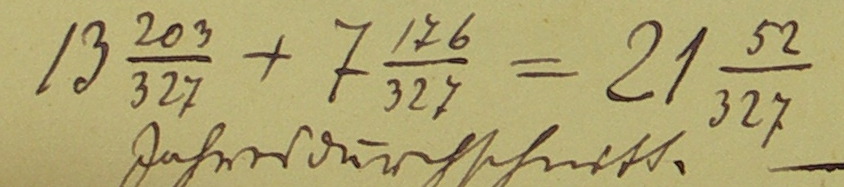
13 203/327 + 7 176/327 = 21 52/327
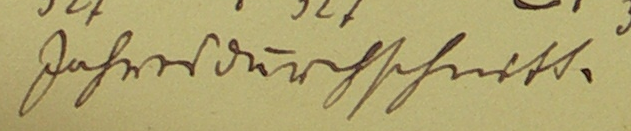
Jahresdurchschnitt.
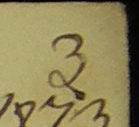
3
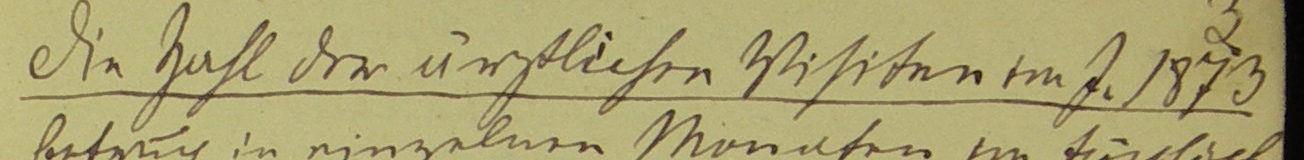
Die Zahl der ärztlichen Visiten im J. 1873
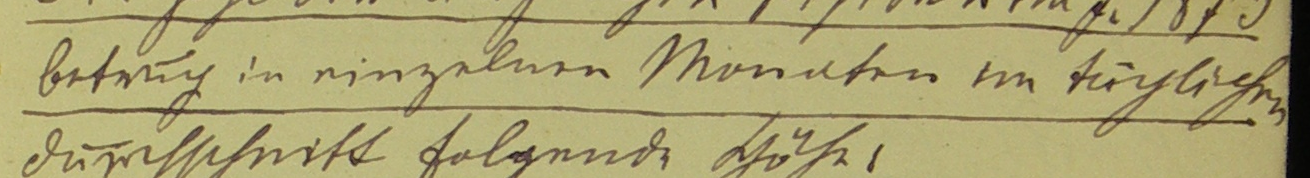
betrug in einzelnen Monaten im täglichen
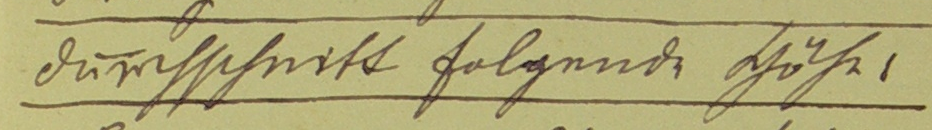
Durchschnitt folgende Höhe:
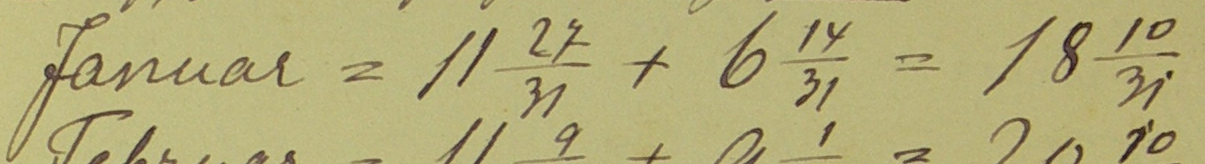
Januar = 11 27/31 + 6 14/31 = 18 10/31
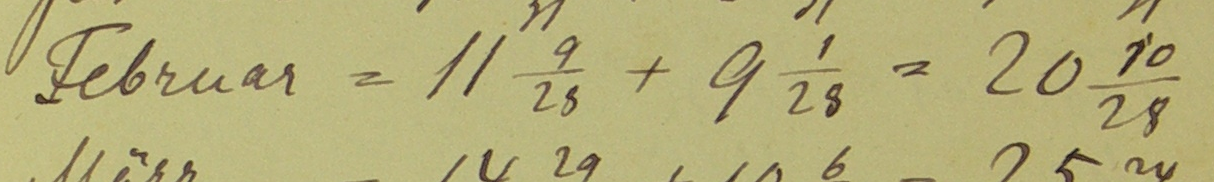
Februar = 11 9/28 + 9 1/28 = 20 10/28
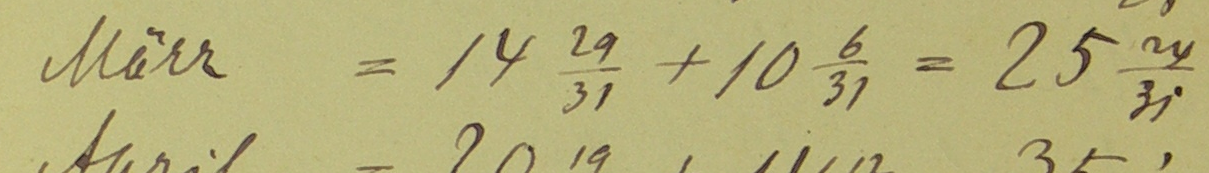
März = 14 29/31 + 10 6/31 = 25 24/31
